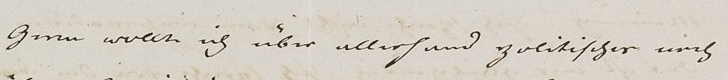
Gerne wollte ich über allerhand politisches noch
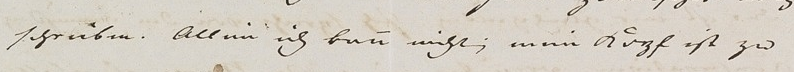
schreiben. Allein ich kann nicht; mein Kopf ist zu
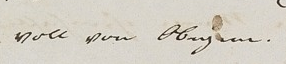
voll von Obigem.
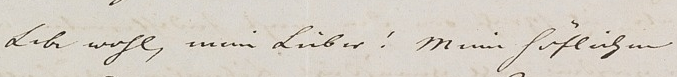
Lebe wohl, mein Lieber! Meine höflichen
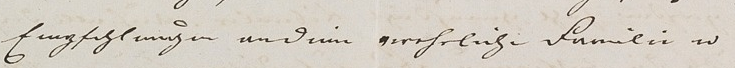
Empfehlungen an deine verehrliche Familie u
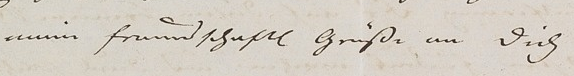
meine freundschaftlichen Grüße an Dich
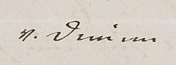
v. Deinem
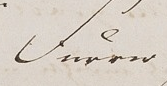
Furrer
